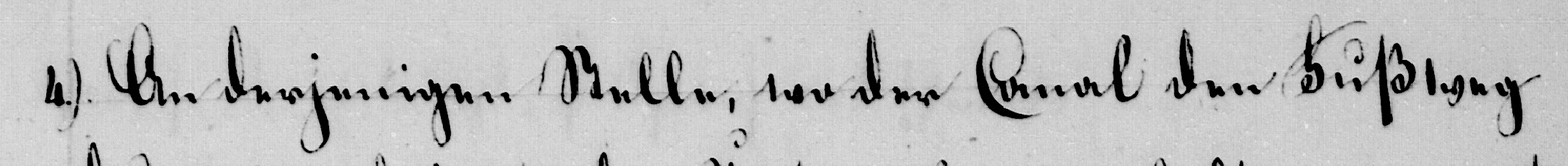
4.) An derjenigen Stelle, wo der Canal den Fußweg
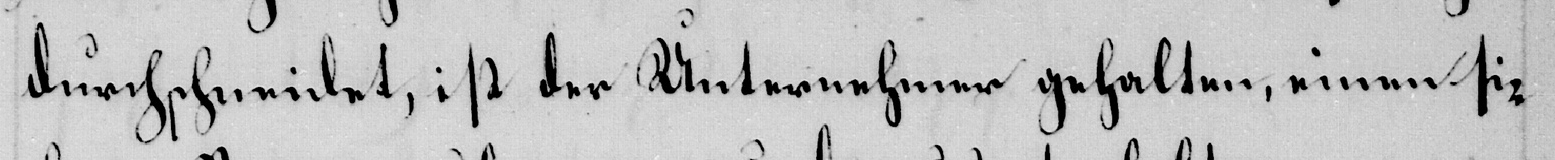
durchschneidet, ist der Unternehmer gehalten, einen sic¬
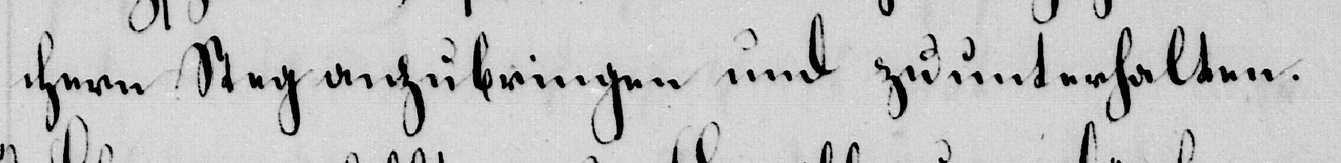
hern Steg anzubringen und zu unterhalten.
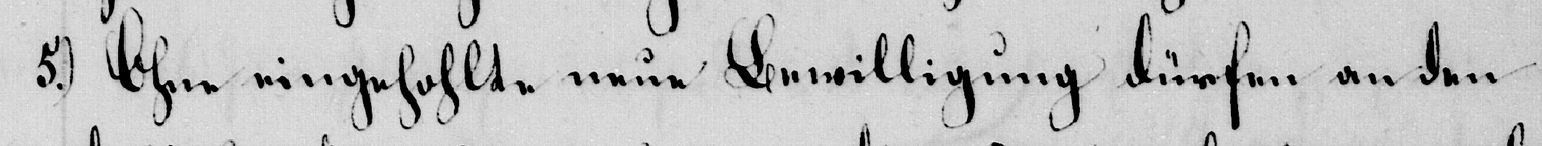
5.) Ohne eingehohlte neue Bewilligung dürfen an den
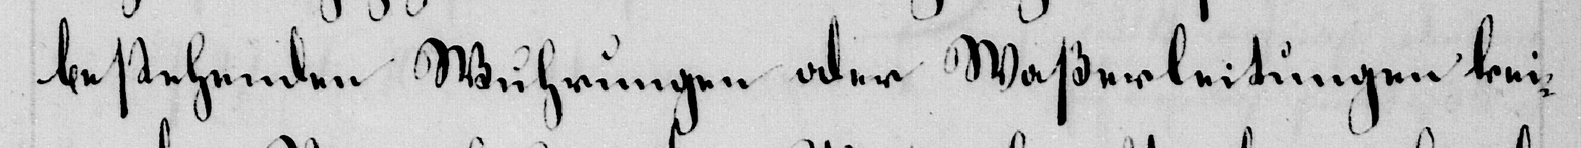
bestehenden Wuhrungen oder Waßerleitungen kei¬
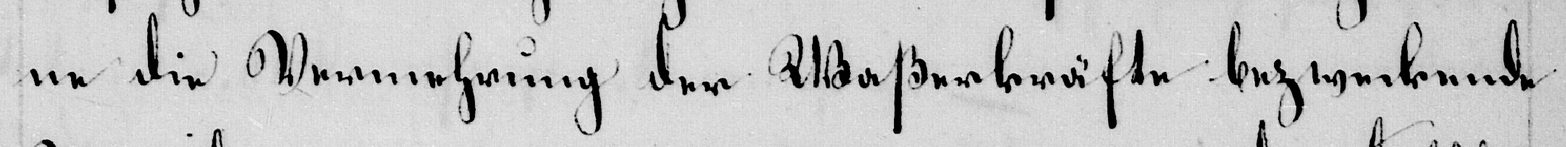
ne die Vermehrung der Waßerkräfte bezweckende
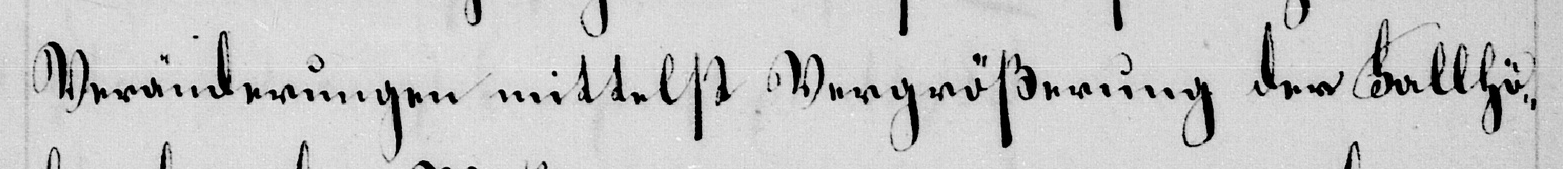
Veränderungen mittelst Vergrößerung der Fallhö¬
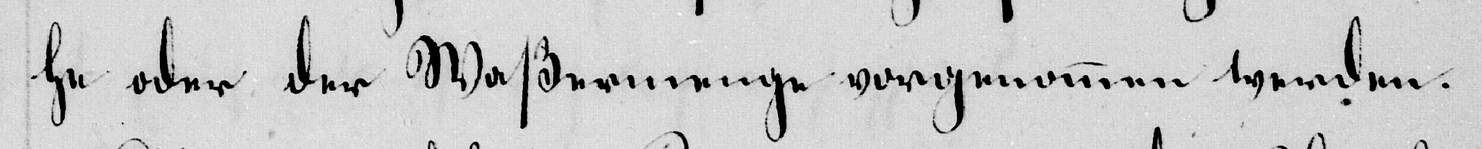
he oder der Waßermenge vorgenommen werden.
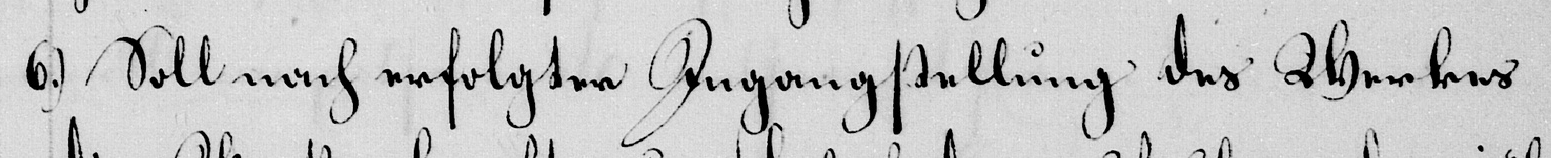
6.) Soll nach erfolgter Ingangstellung des Werkes
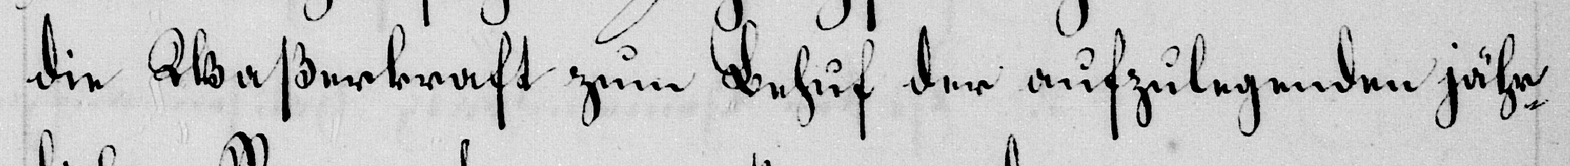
die Waßerkraft zum Behuf der aufzulegenden jähr¬
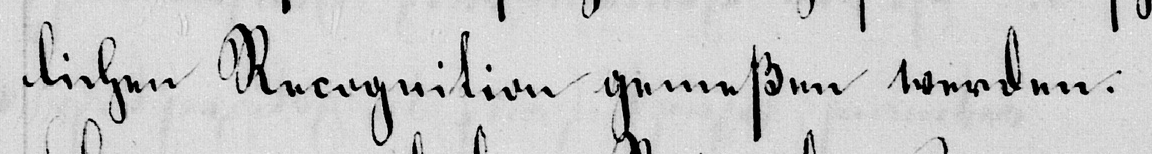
lichen Recognition gemeßen werden.
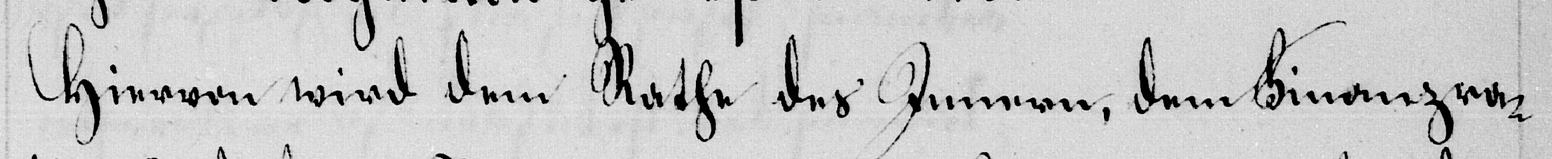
Hiervon wird dem Rathe des Innern, dem Finanzra¬
